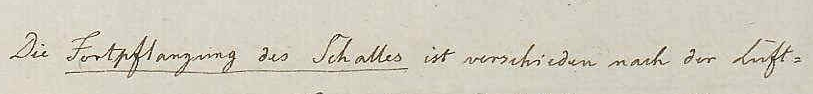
Die Fortpflanzung des Schalles ist verschieden nach der Luft-
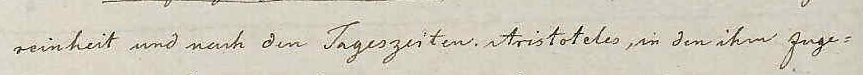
reinheit und nach den Tageszeiten. Aristoteles, in den ihm zuge-
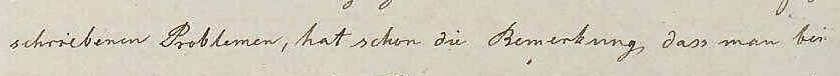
schriebenen Problemen, hat schon die Bemerkung, dass man bei
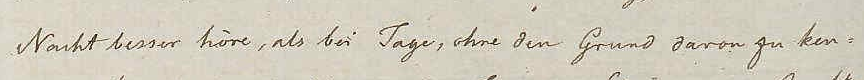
Nacht besser höre, als bei Tage, ohne den Grund davon zu ken-
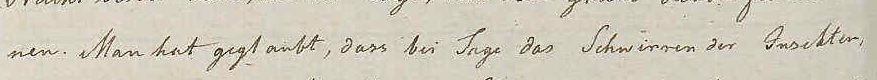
nen. Man hat geglaubt, dass bei Tage das Schwirren der Insekten,
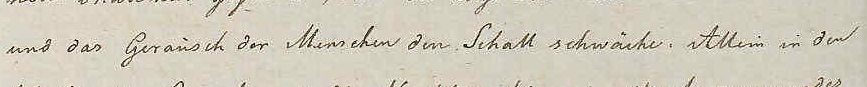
und das Geräusch der Menschen den Schall schwäche. Allein in den
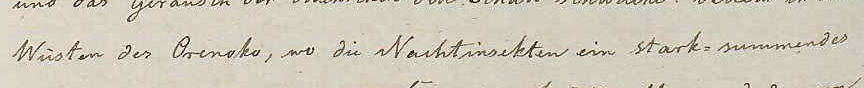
Wüsten des Orenoko, wo die Nachtinsekten ein stark-summendes
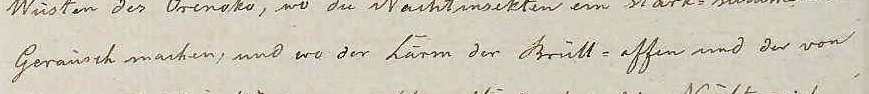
Geräusch machen, und wo der Lärm der Brüll-affen und den von
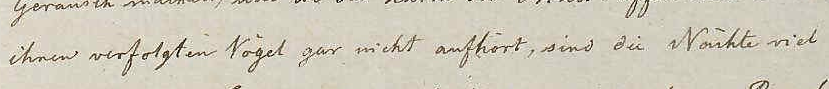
ihnen verfolgten Vögel gar nicht aufhört, sind die Nächte viel
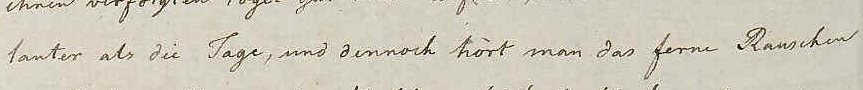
lauter als die Tage, und dennoch hört man das ferne Rauschen
